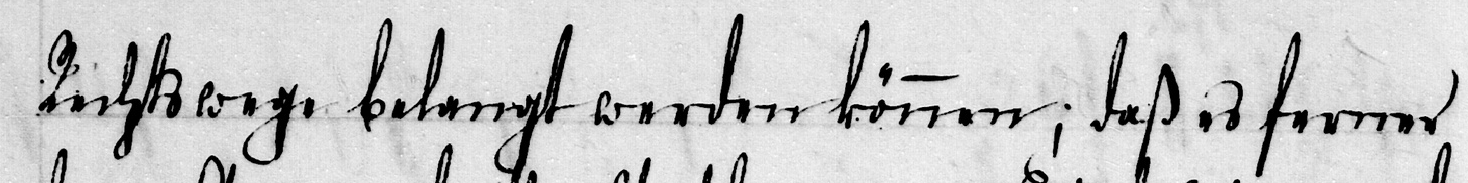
Rechtswege belangt werden können; daß es ferner
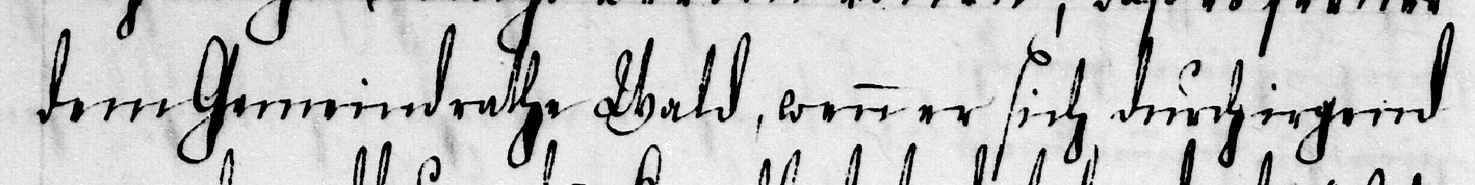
dem Gemeindrathe Wald, wenn er sich durch irgend
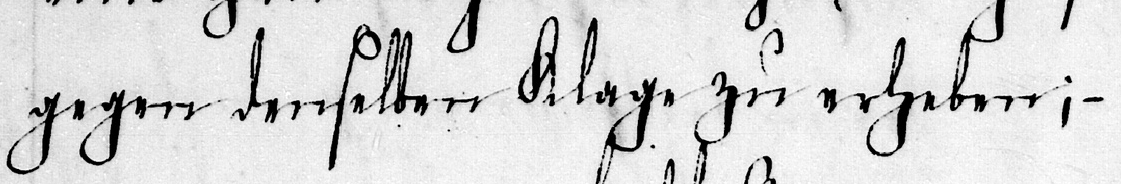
gegen denselben Klage zu erheben; –
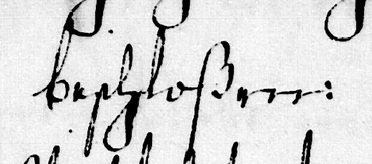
beschloßen:
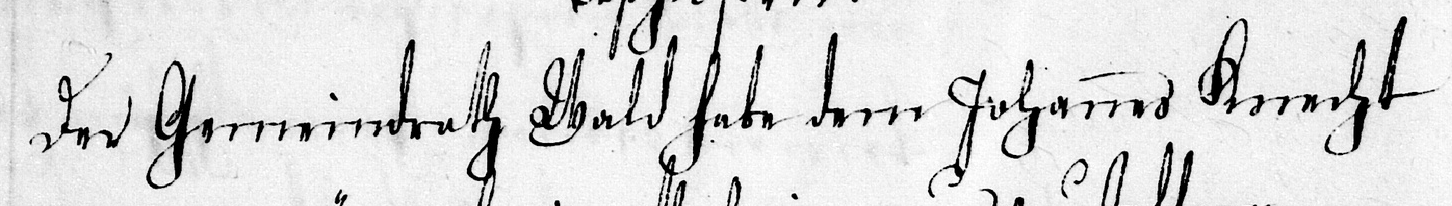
Der Gemeindrath Wald habe dem Johannes Knecht
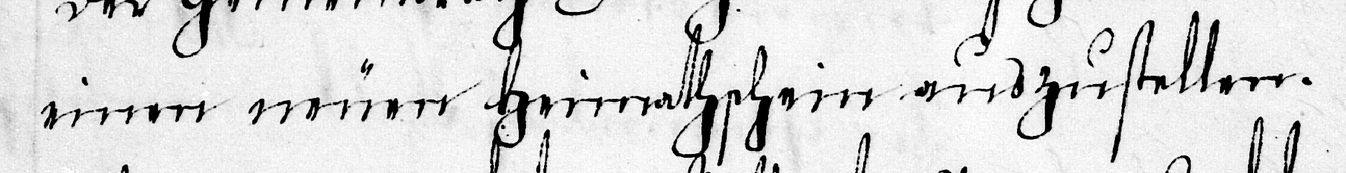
einen neuen Heimathschein auszustellen.
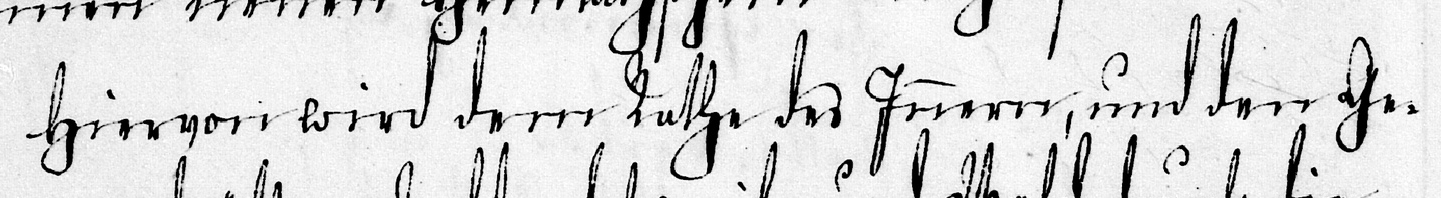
Hiervon wird dem Rathe des Innern, und den Ge¬
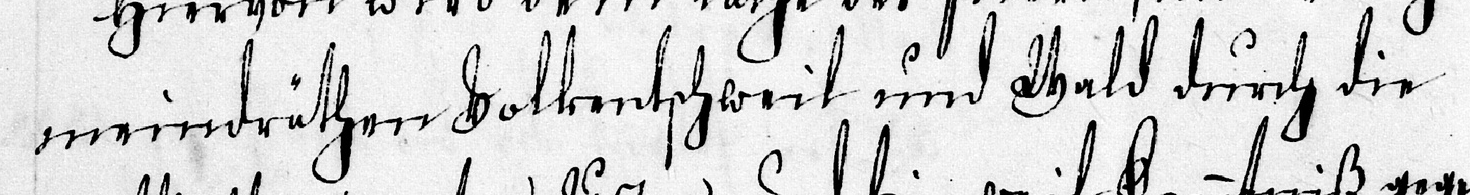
meindräthen Volkentschweil und Wald durch die
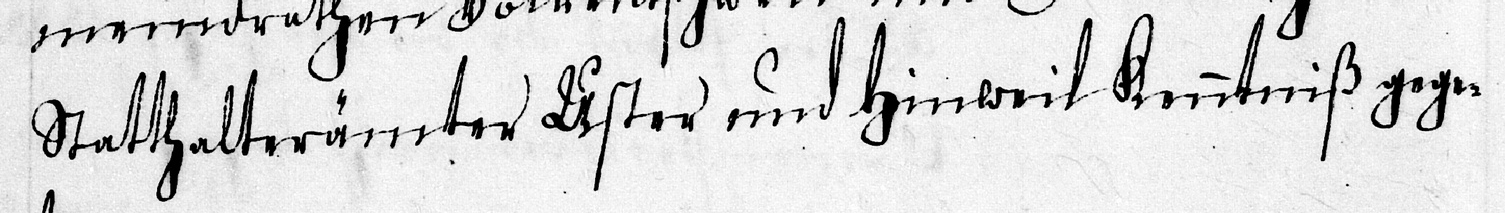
Statthalterämter Uster und Hinweil Kenntniß gege¬
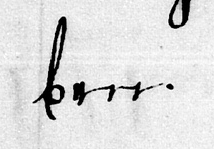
ben.
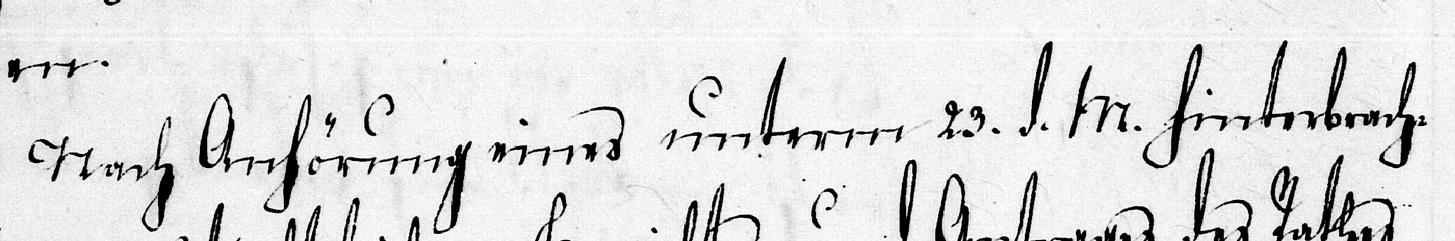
Nach Anhörung eines unterm 23. d. M. hinterbrach¬
